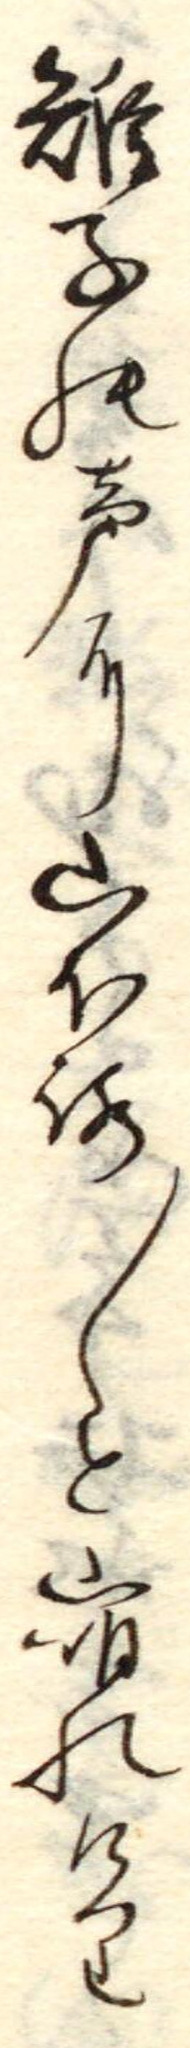雉子の声に山下ろゝと崩れけり
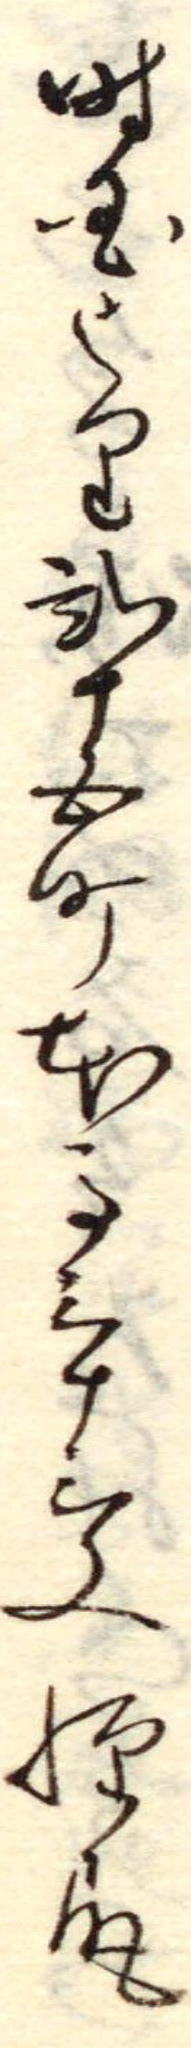時国より弐十五町本馬三十三文軽尻
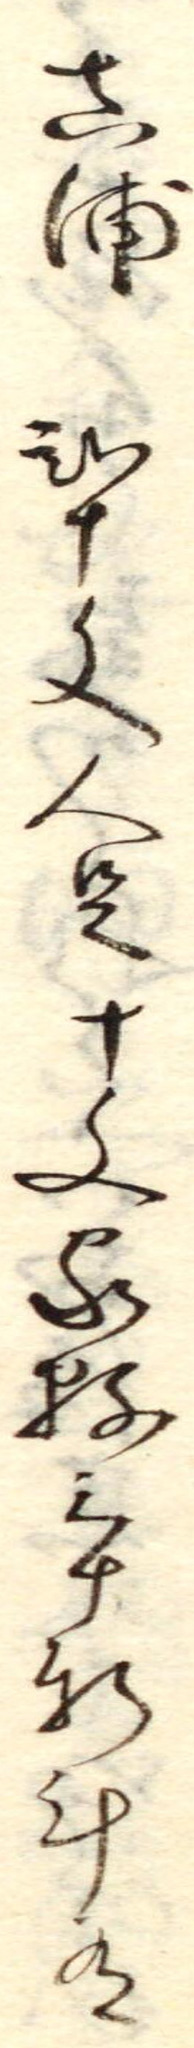真浦弐十文人足十文家数三十軒斗有
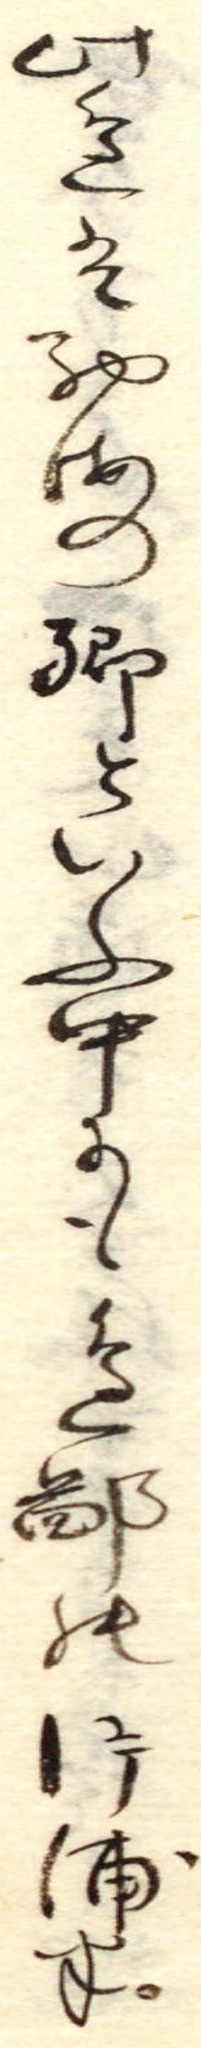此辺は西海の郷といふ中にも辺鄙の片浦は
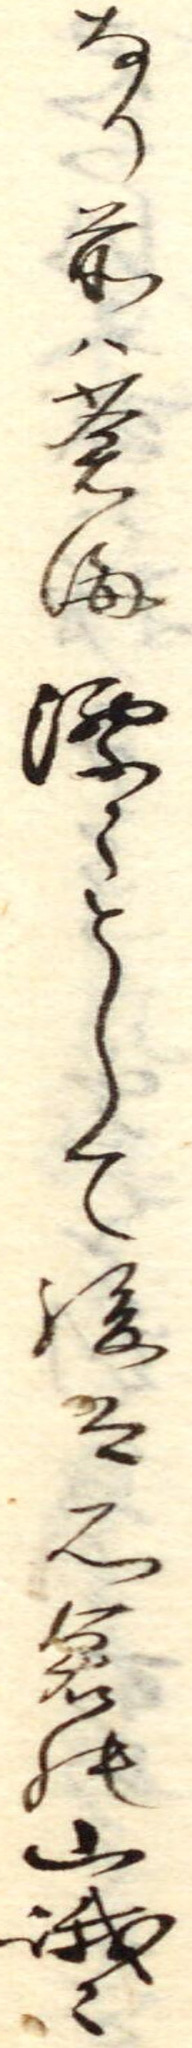なり前は蒼海漂々として後は石倉の山峨々
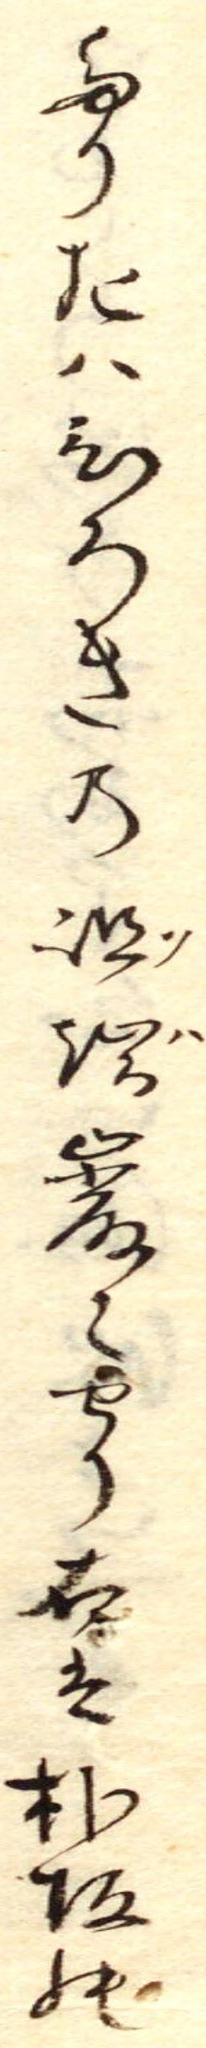たり左はひろきの岨端巌々せり右は朴坂の
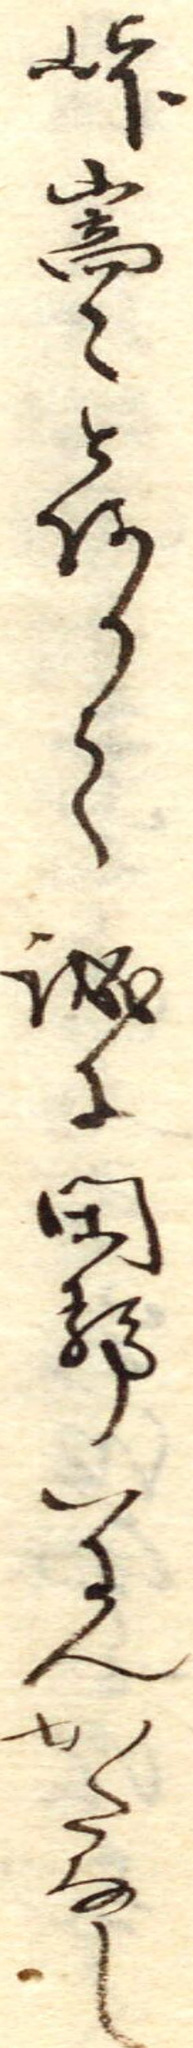峠嵩々とありて誠に閑静いわんかたなし
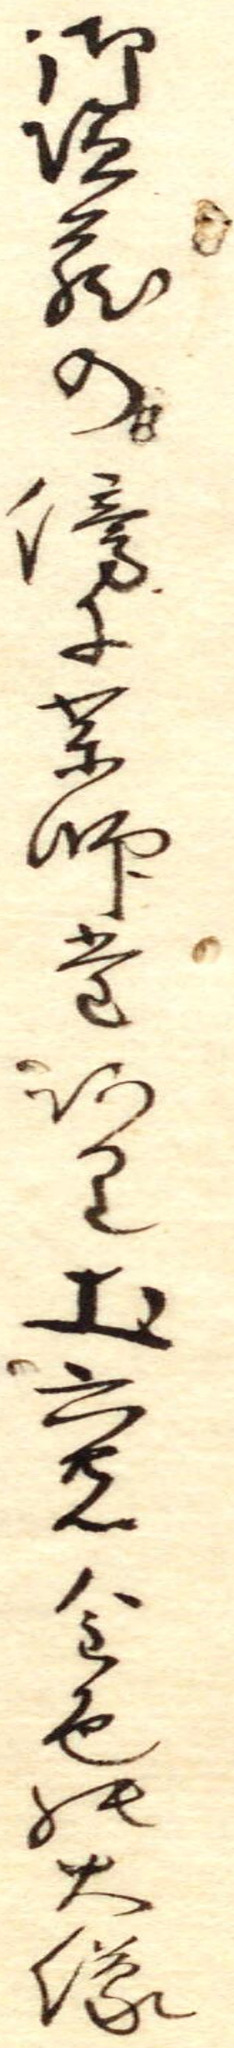御塩蔵の傍に薬師堂あり丈六の金色の大像
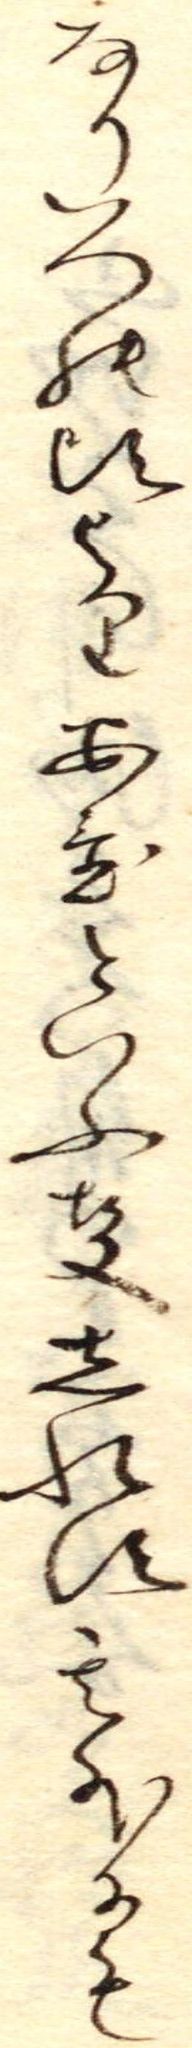なりいつの頃より安置といふ事しれす其外にも
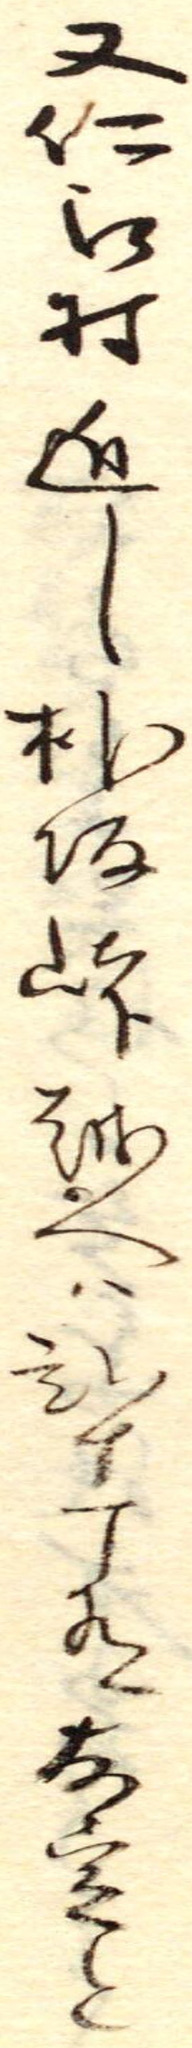又仁江村近し朴坂峠越へは弐十丁有友定と
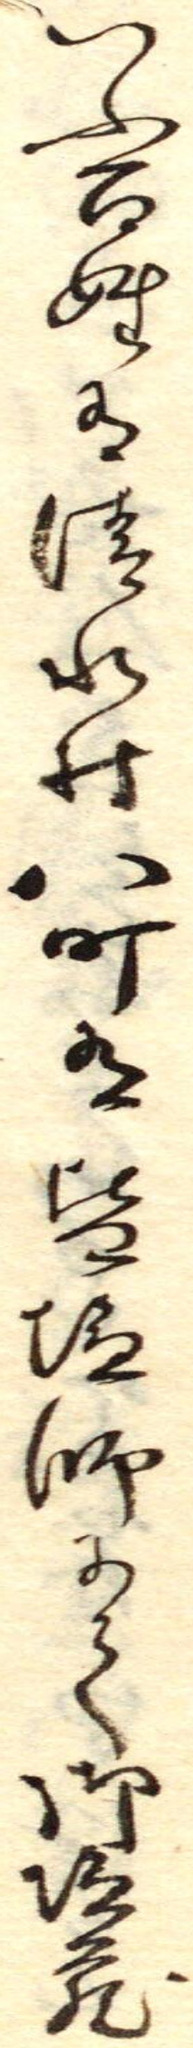いふ百姓有清水村八町有皆塩師にて御塩蔵
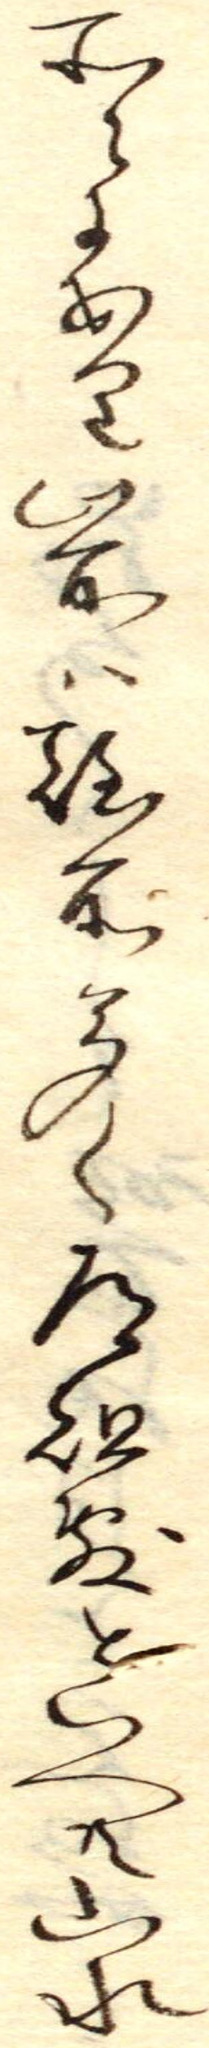所々にあり此所は難所多く道砠敷といへ共山水
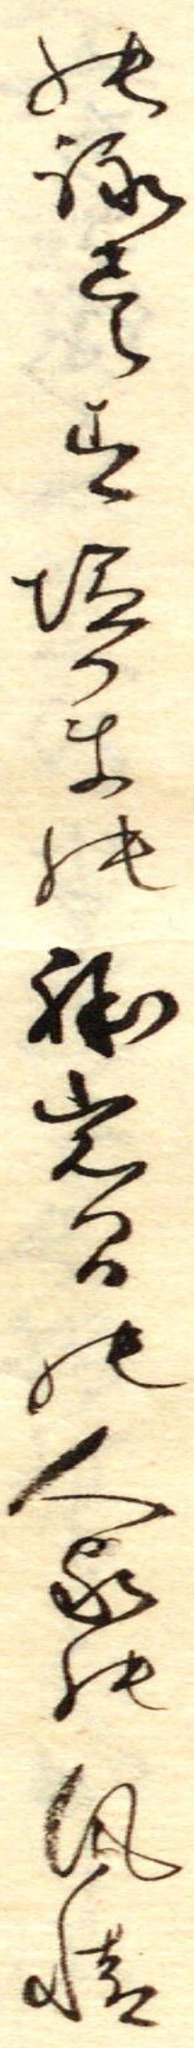の詠す塩かまの躰岩間の人家の風情

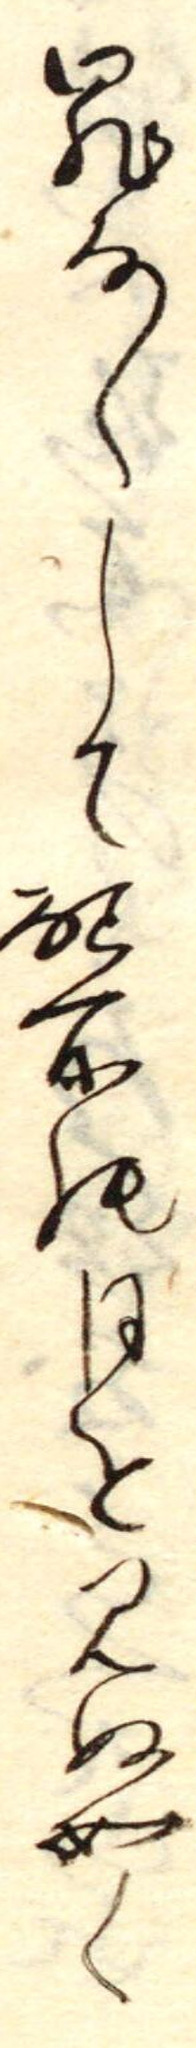罪なくして配所の月を見ぬ如く
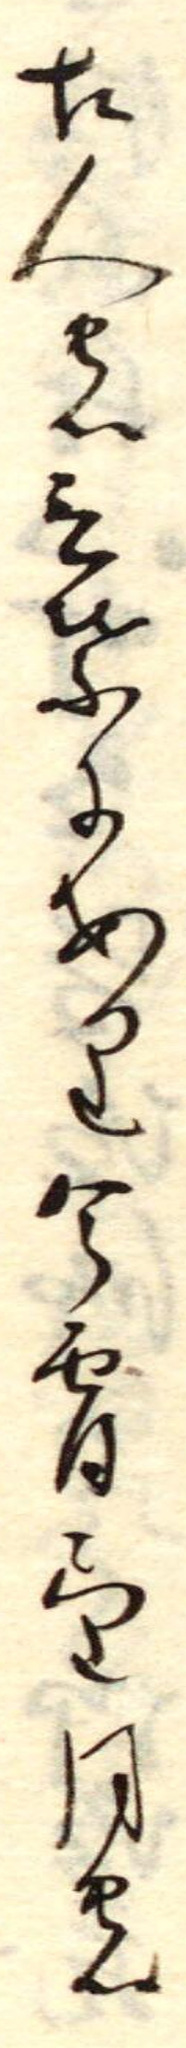古人の言葉にあり今宵望月の
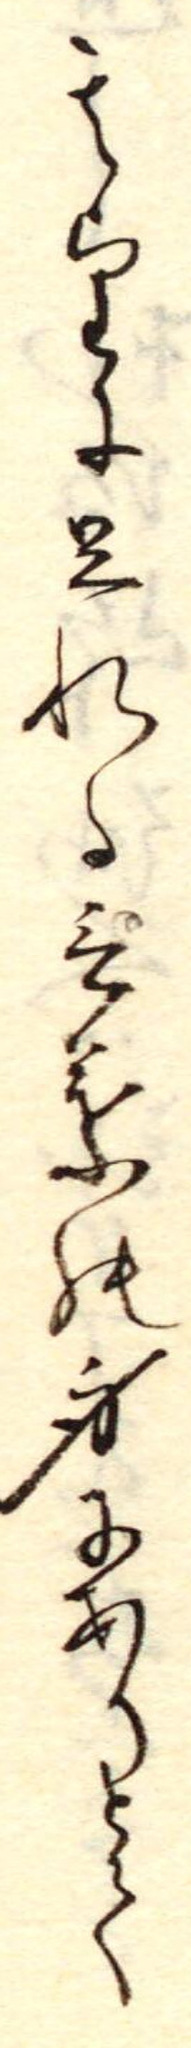其望に足れる言葉の身にありとて
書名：能登名跡誌
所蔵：Ishikawa Prefectural Library
